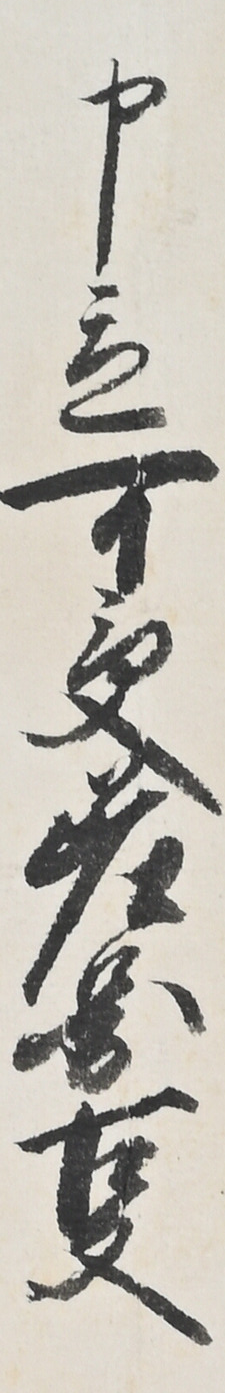申立可受差図事
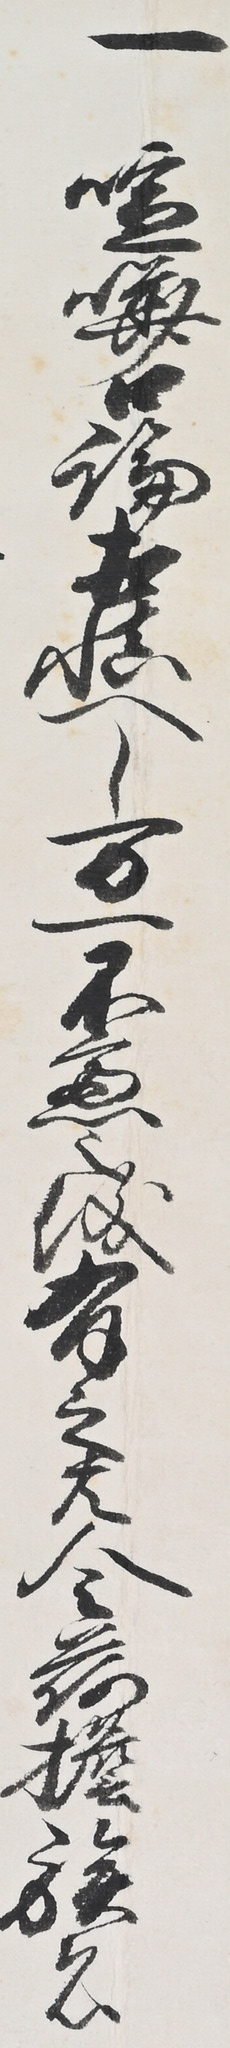一喧嘩口論相慎へし万一不慮之儀有之共令荷担族者
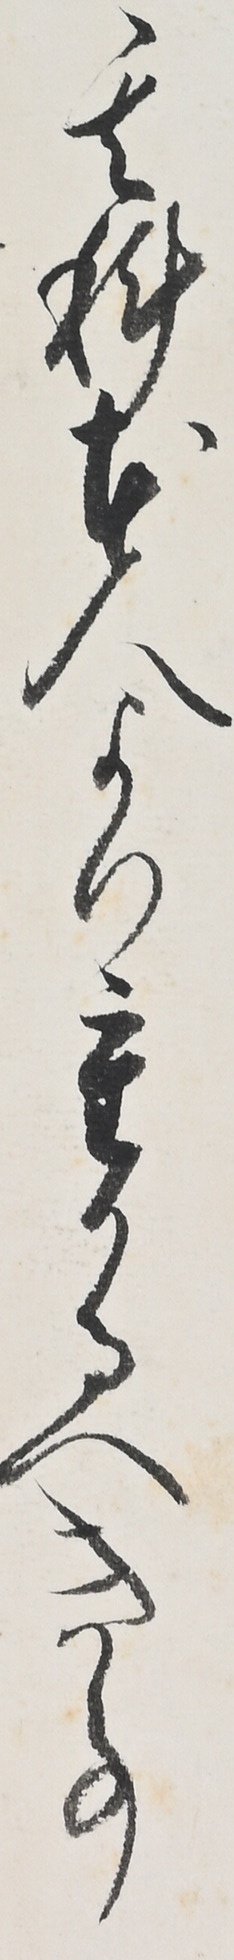其科本人より重かるへき事
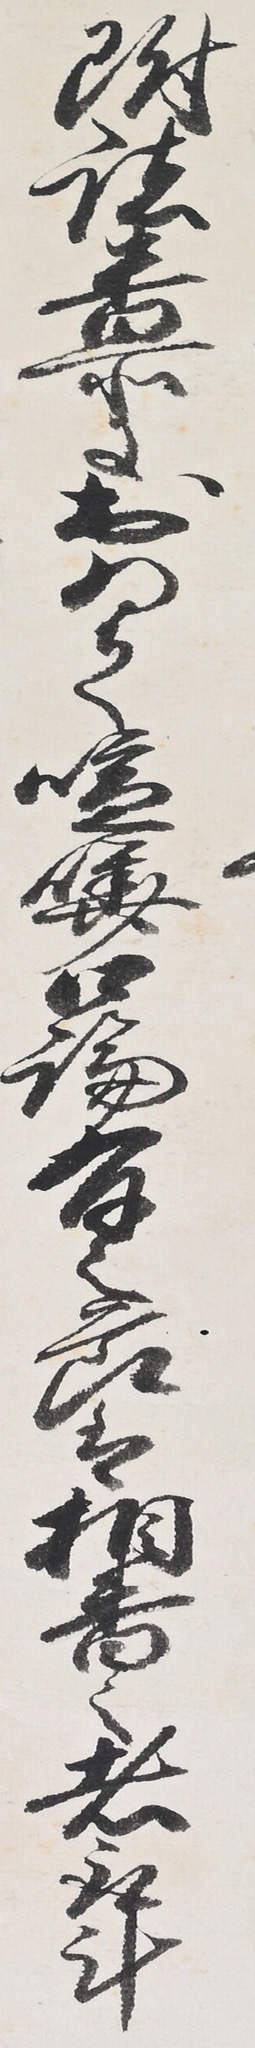附諸番所におゐて喧嘩口論有之節は相番之者取斗
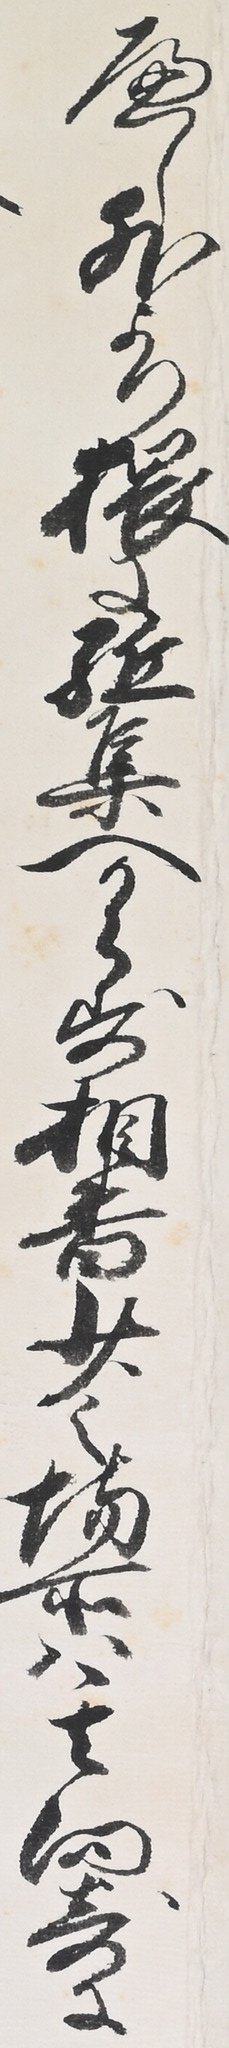へし外より猥に駈集へからす相番少之場所ハ其向寄に
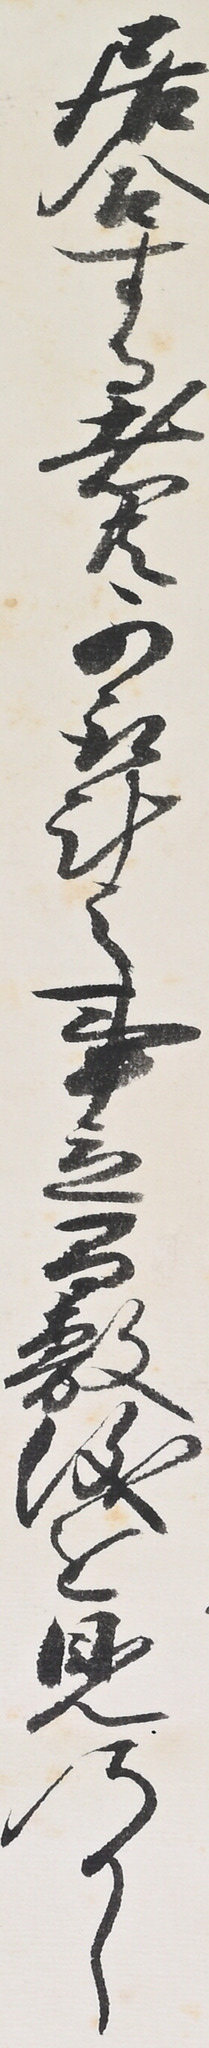居合する者共可取斗之事立間敷儀を見のかし
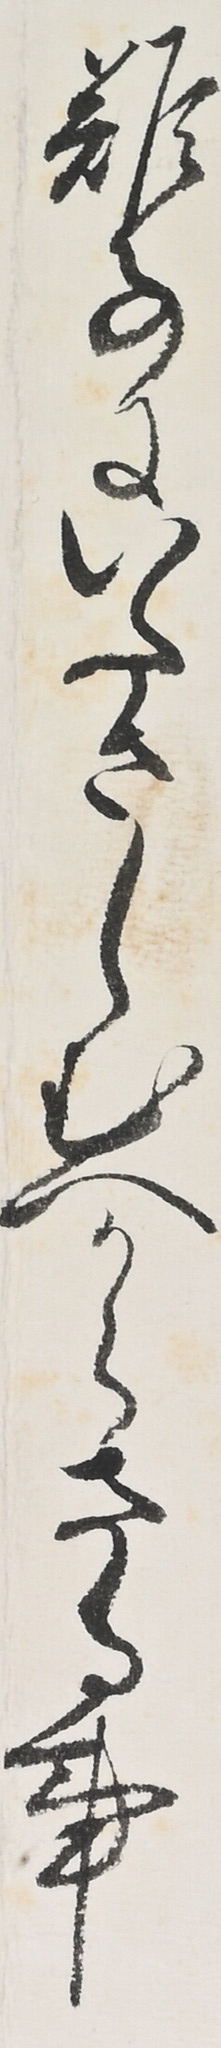難事にいたさしむへからさる事
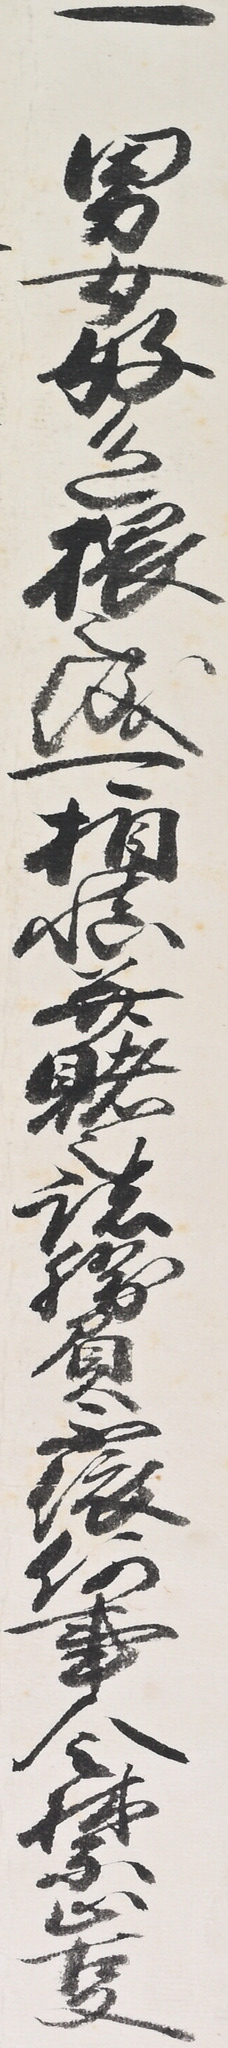一男女好色猥之儀可相慎幷賭之諸勝負不依何事令禁止事
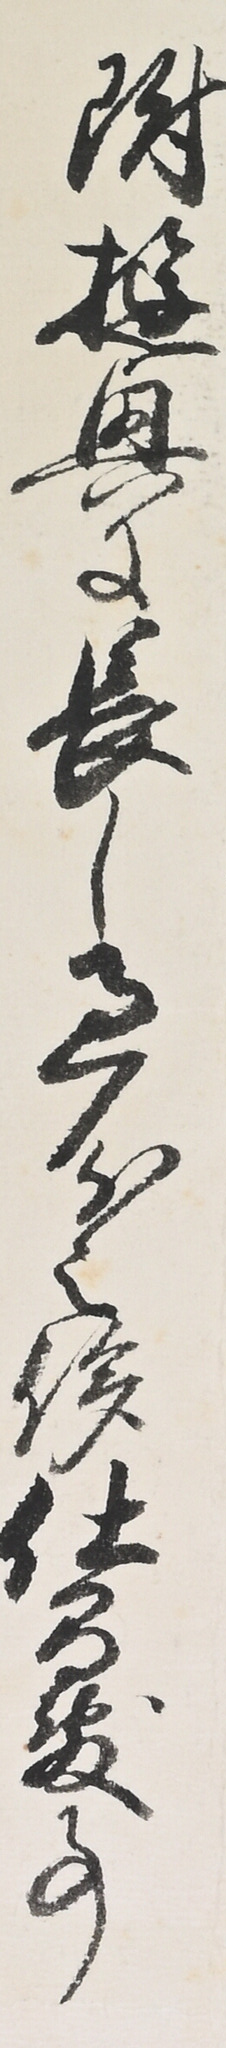附遊興に長し過分之侈仕間敷事

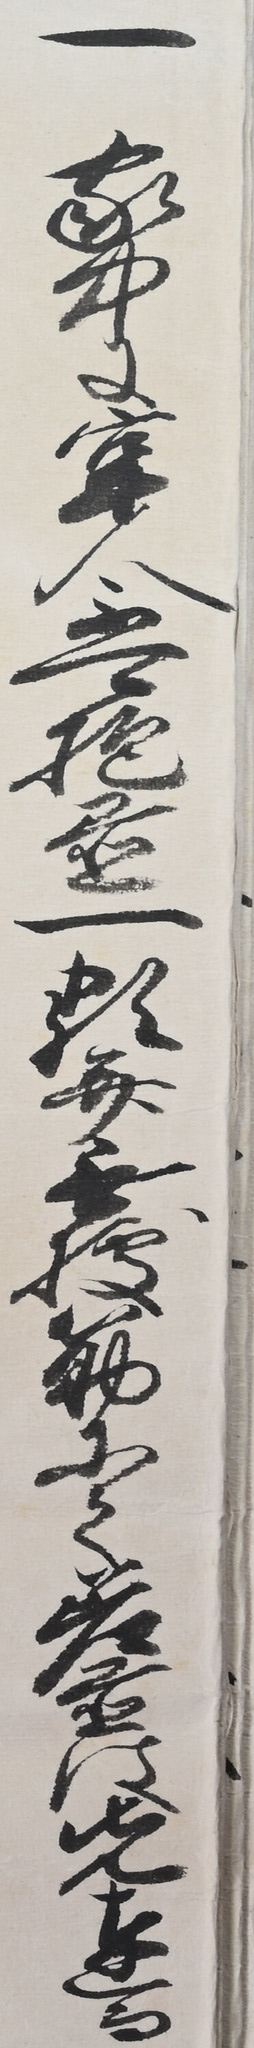一家中に牢人不可抱置一類幷無拠筋にて差置は先達而
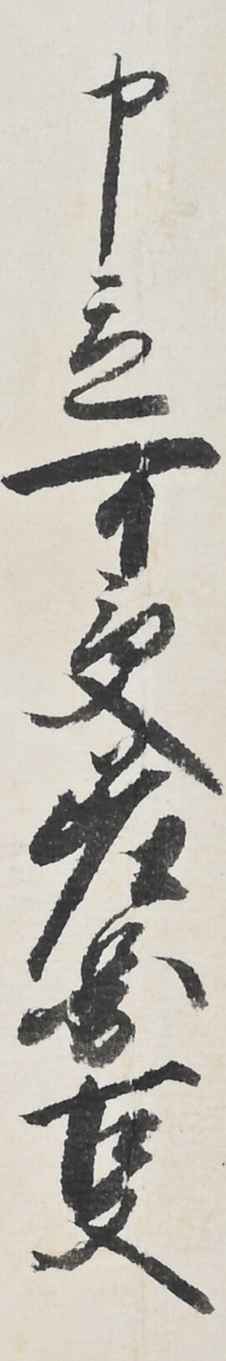申立可受差図事
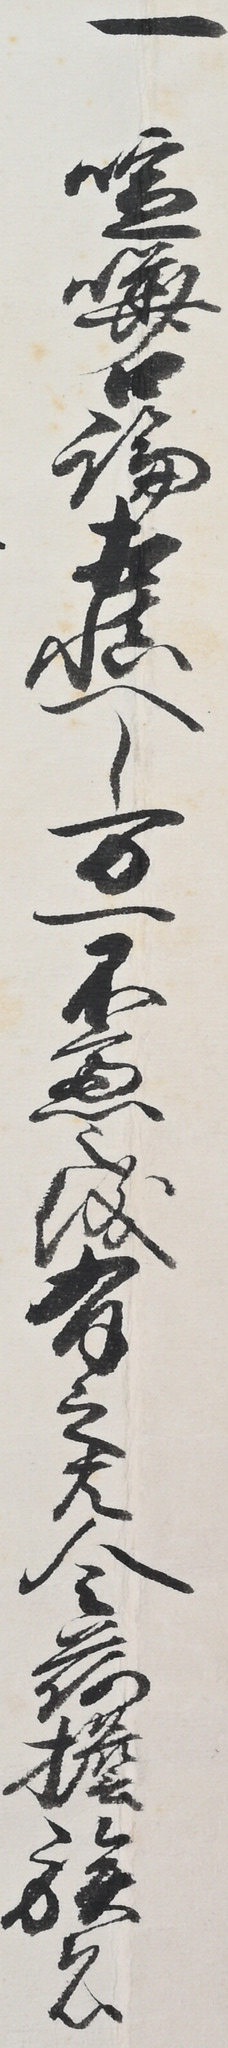一喧嘩口論相慎へし万一不慮之儀有之共令荷担族者
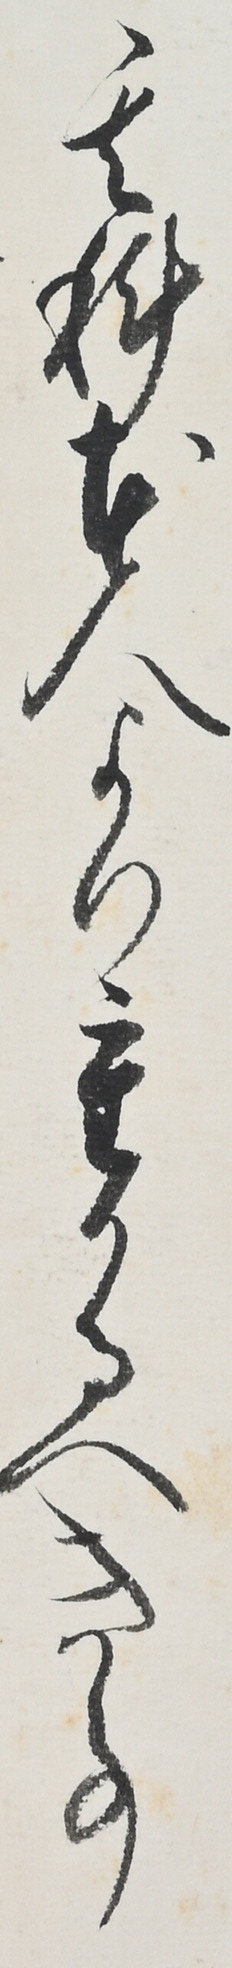其科本人より重かるへき事
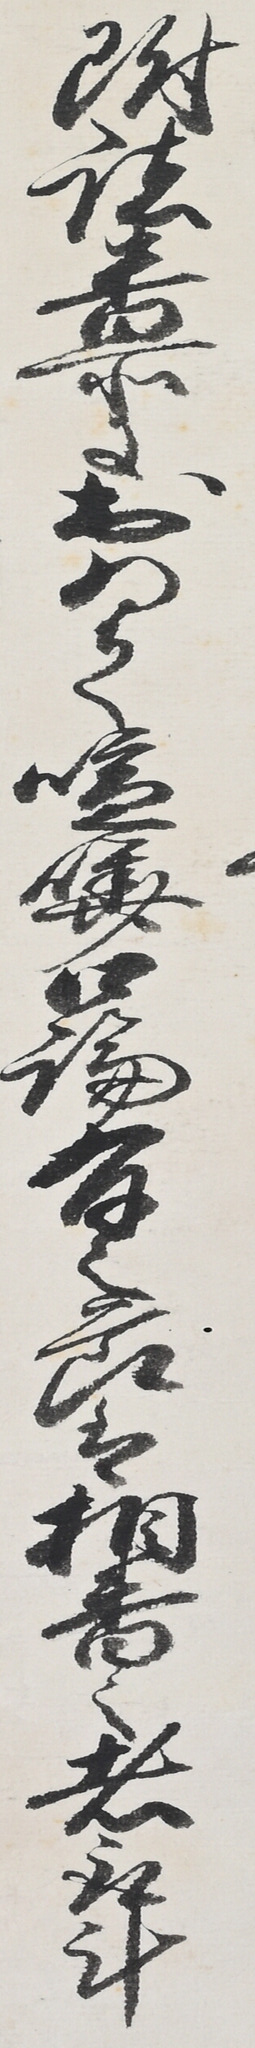附諸番所におゐて喧嘩口論有之節は相番之者取斗
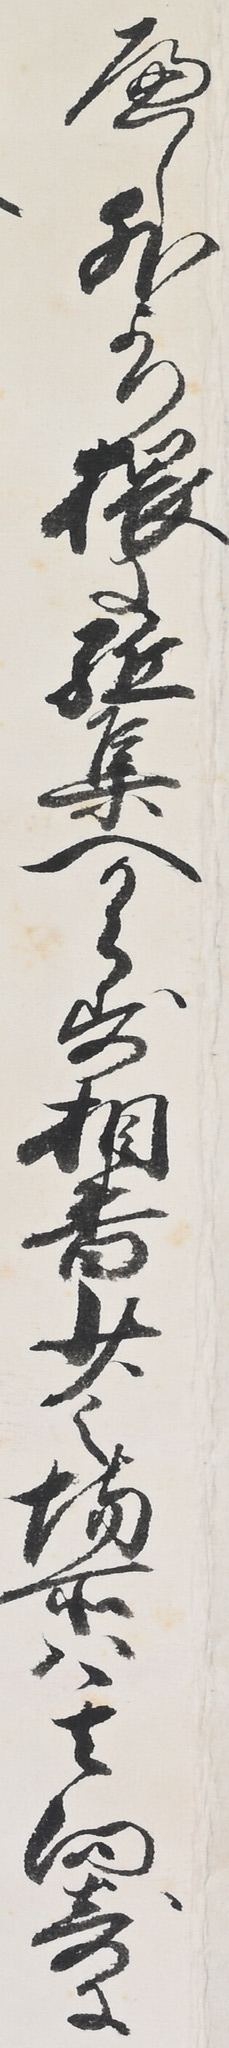へし外より猥に駈集へからす相番少之場所ハ其向寄に
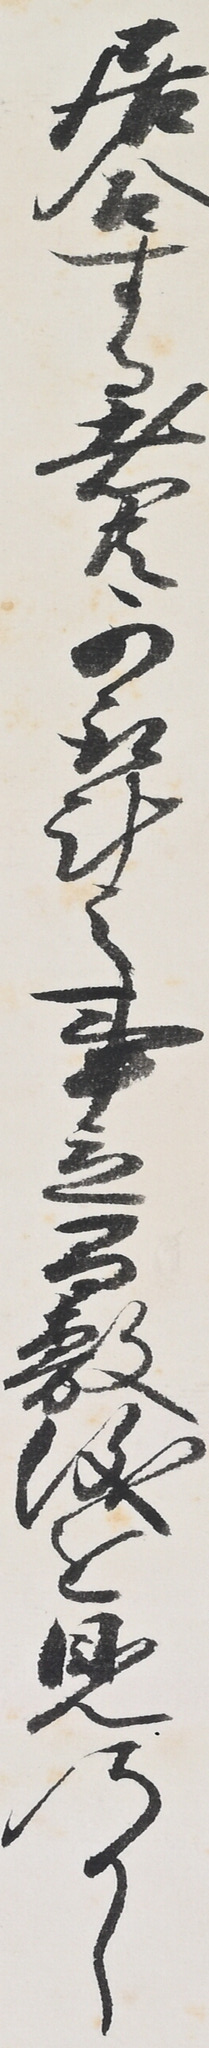居合する者共可取斗之事立間敷儀を見のかし
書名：御条目〔同文二通一括〕
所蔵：伊那市立高遠町図書館・合同会社AMANE
